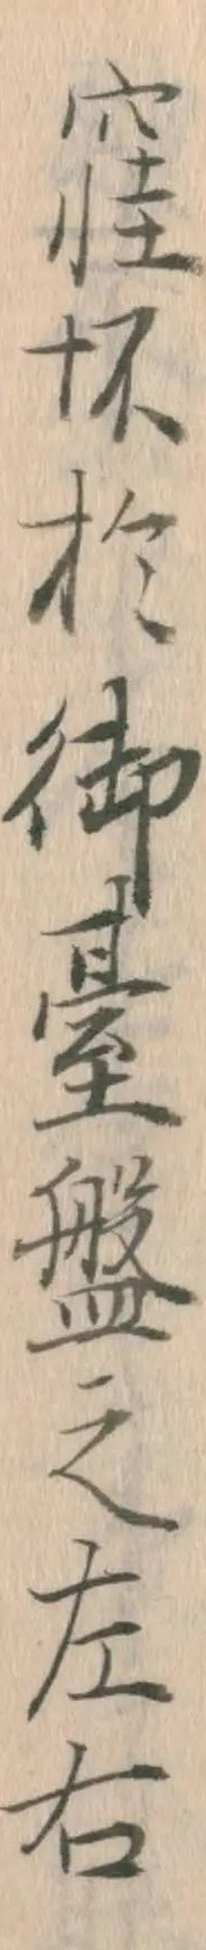窪坏於御台盤之左右
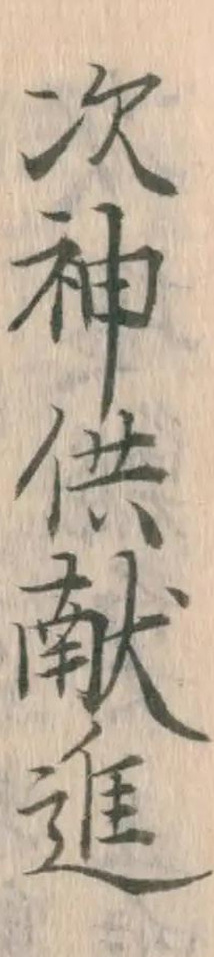次神供献進

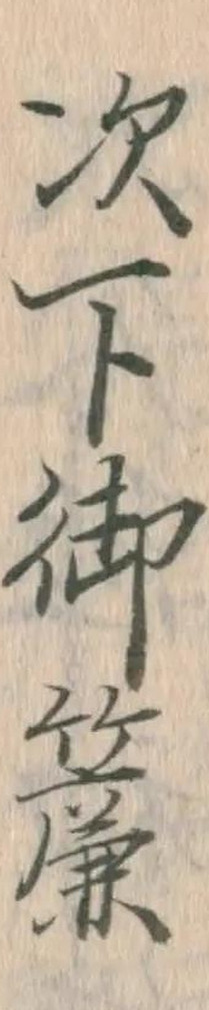次下御簾
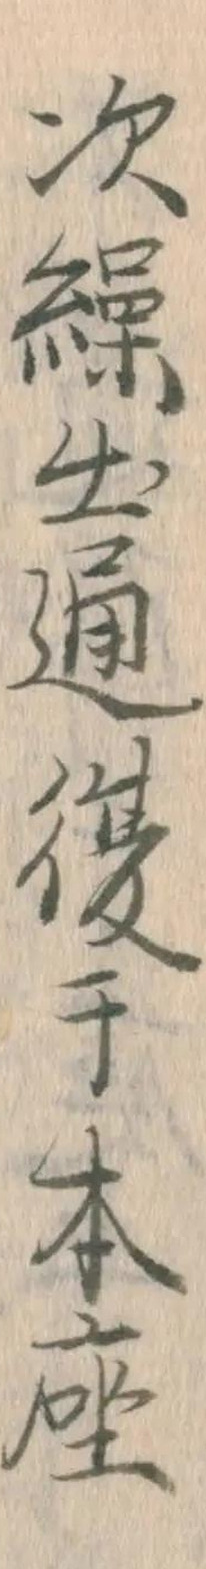次繰出通復于本座
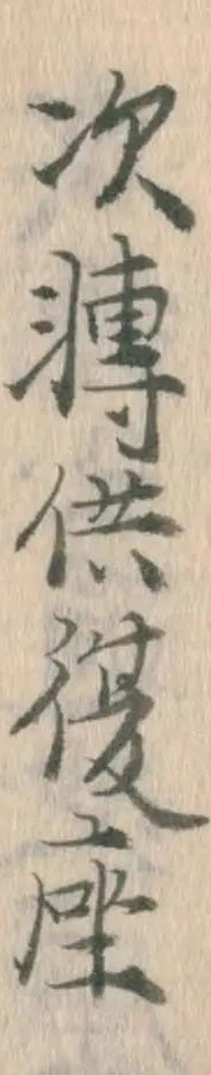次転供復座
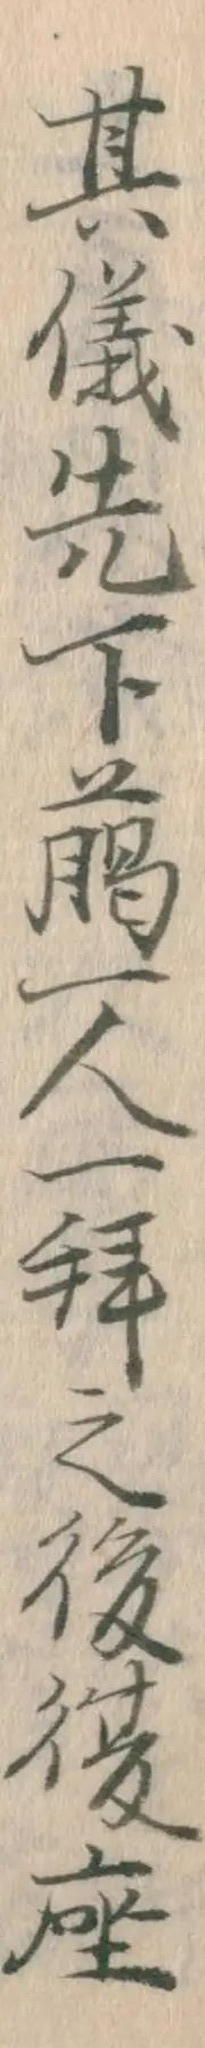其儀先下臈一人一拜之後復座
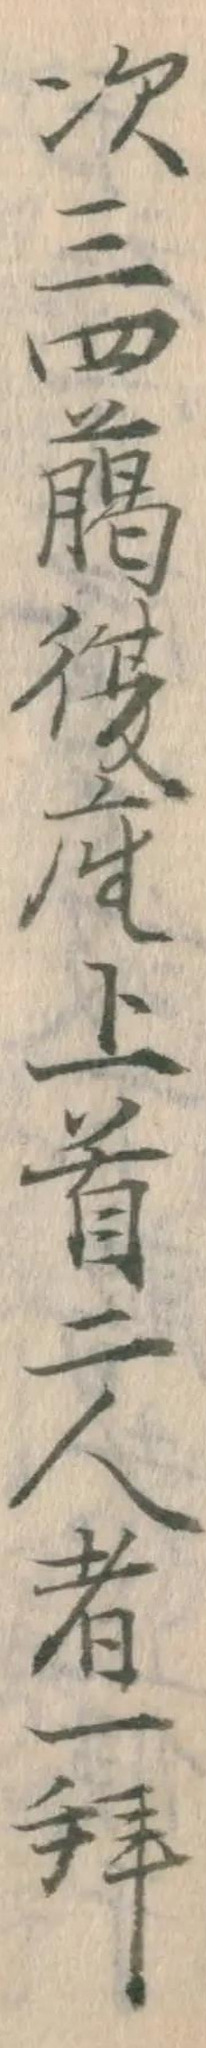次三四臈復座上首二人者一拜
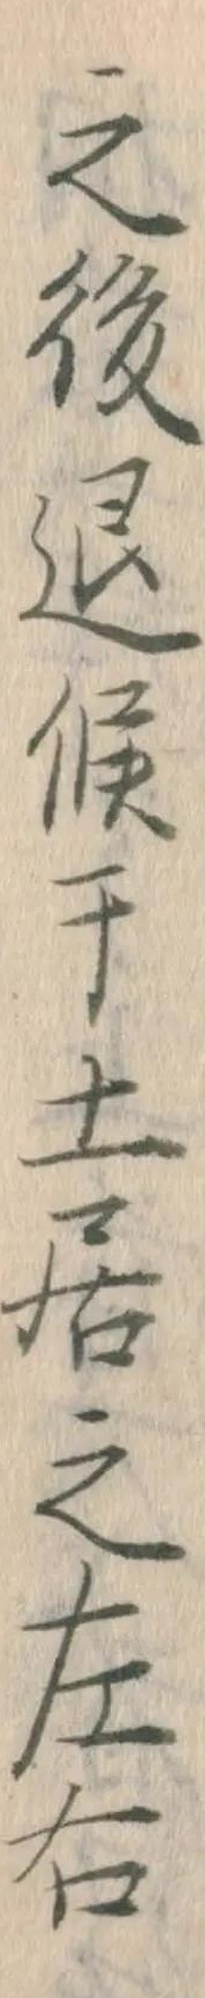之後退候于土居之左右
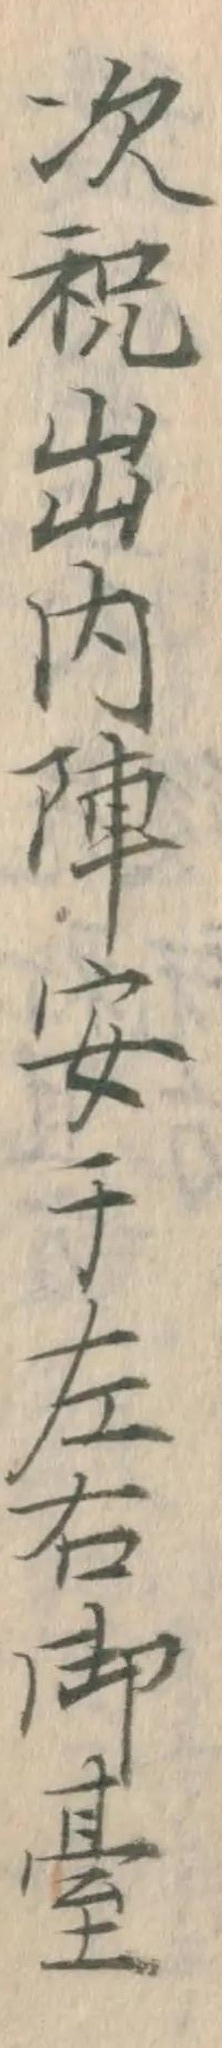次祝出内陣安于左右御台

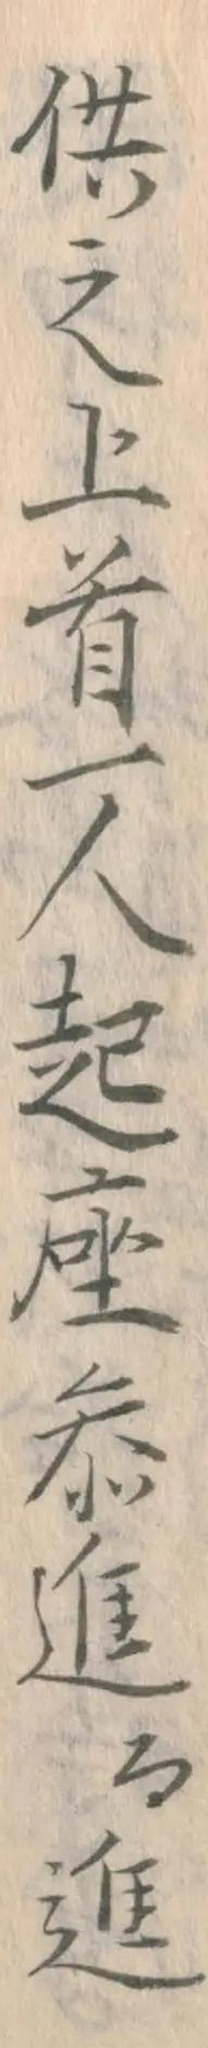供之上首一人起座参進而進
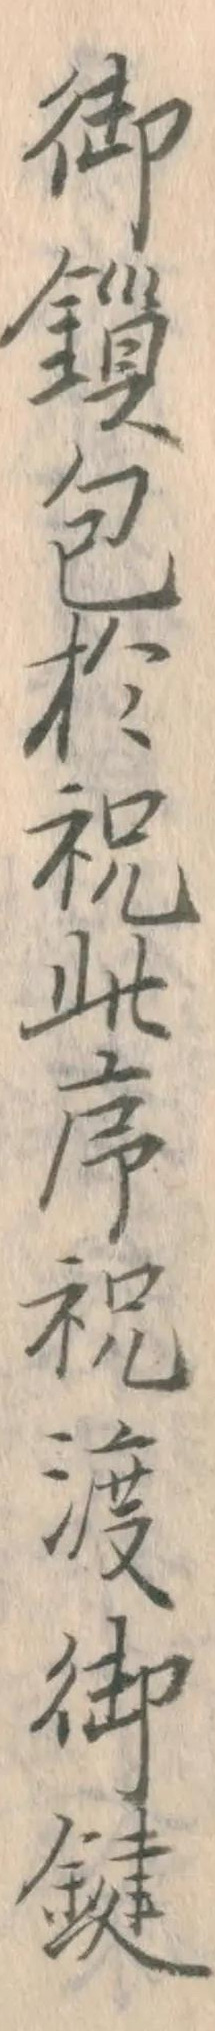御鎖包於祝此序祝渡御鍵
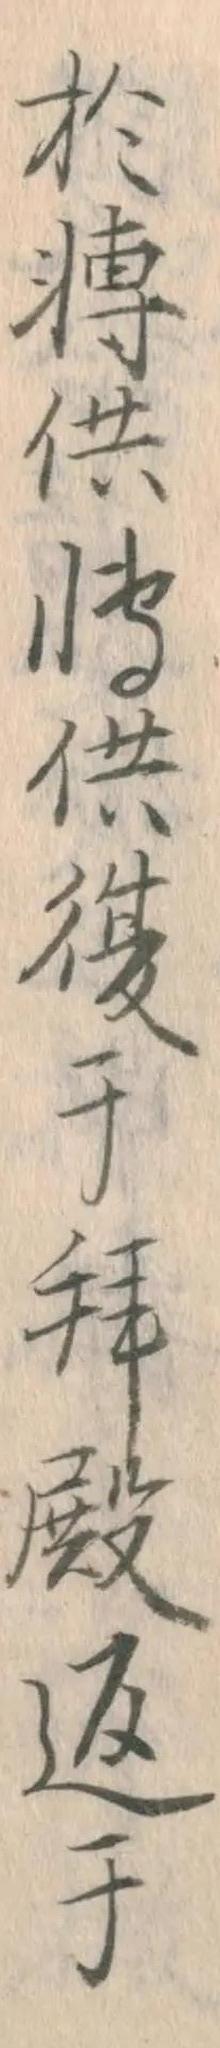於転供転供復于拝殿返于
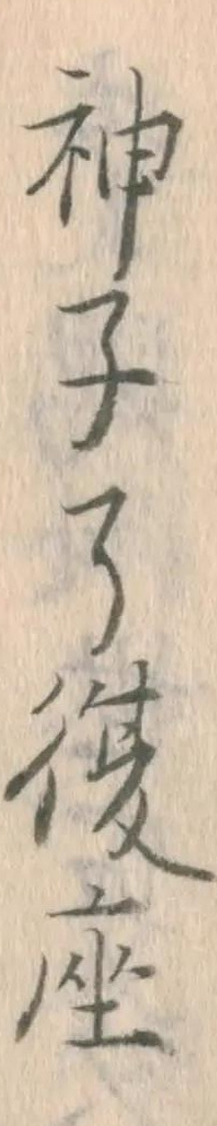神子了復座
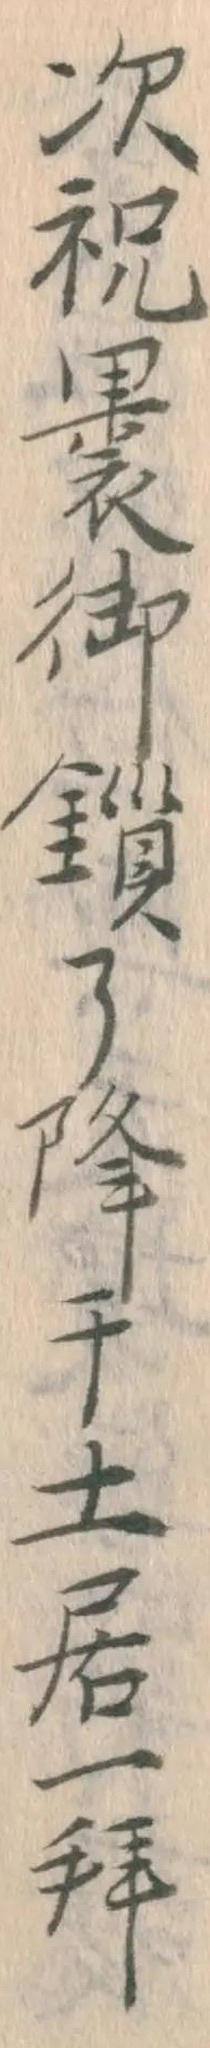次祝嚢御鎖了降于土居一拜
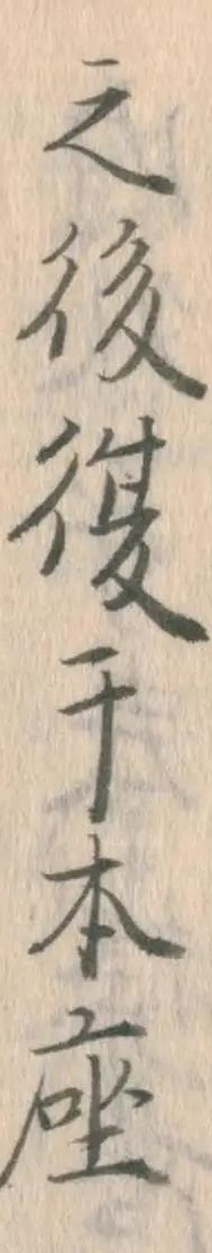之後復于本座
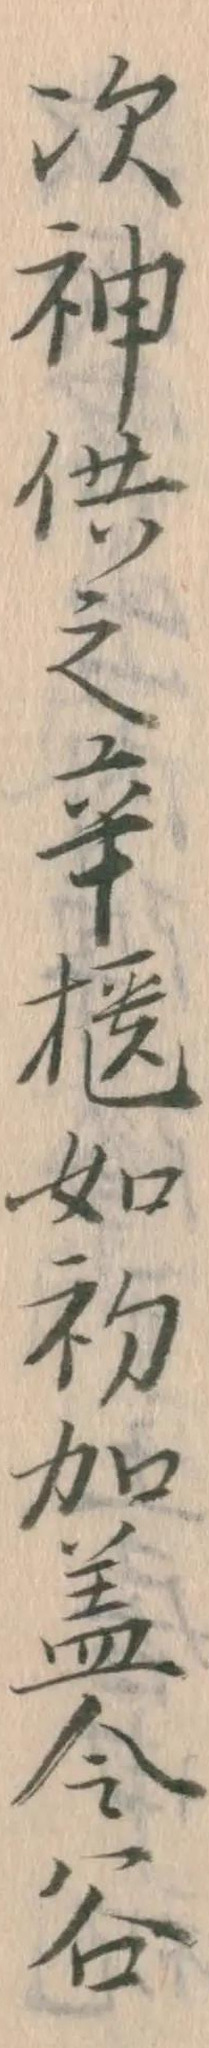次神供之辛櫃如初加蓋令谷
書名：賀茂社記録. 第81冊
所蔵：国立国会図書館 National Diet Library, JAPAN
